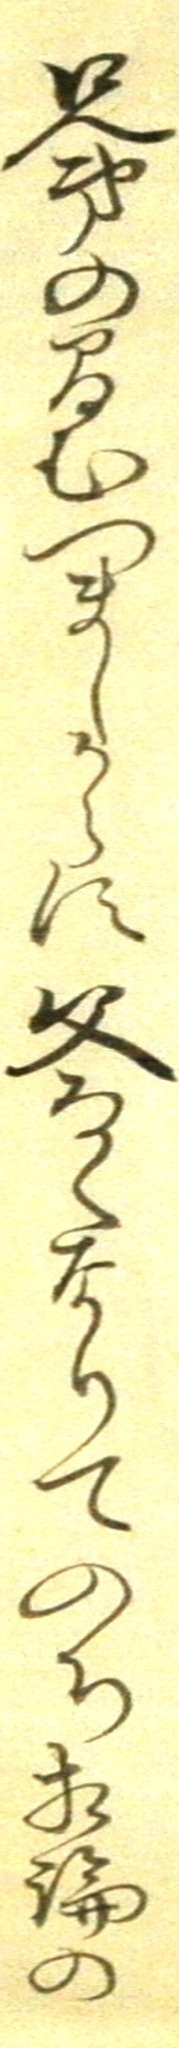兄弟の間むつましからす父なくなりてのち相論の
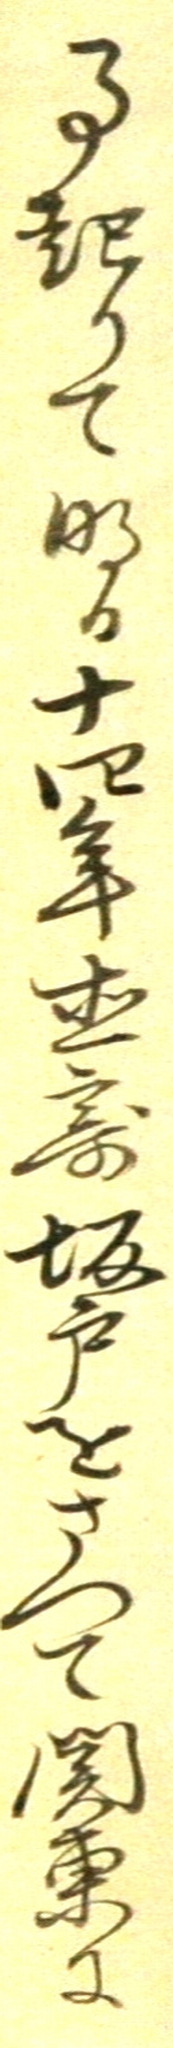事起りて明る十四年直寄坂戸をさつて関東に

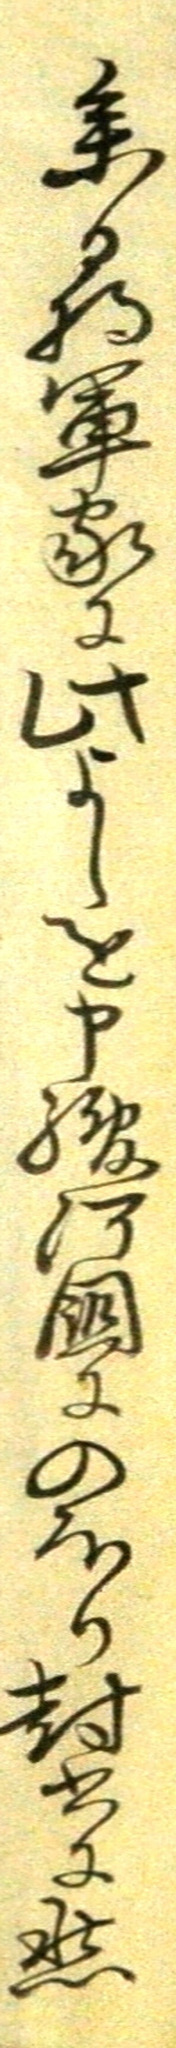参る将軍家に此よしを申駿河国にのほり封書に愁
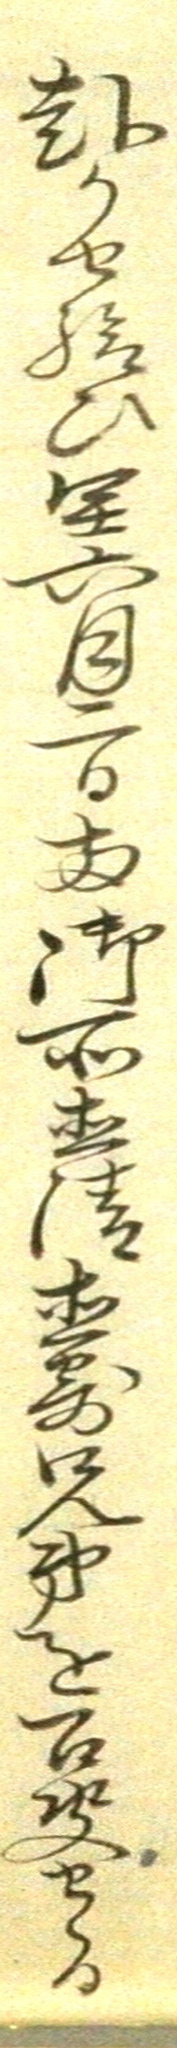赴かせ給ひ閏六月二日両御所直清直寄兄弟を召決せらる
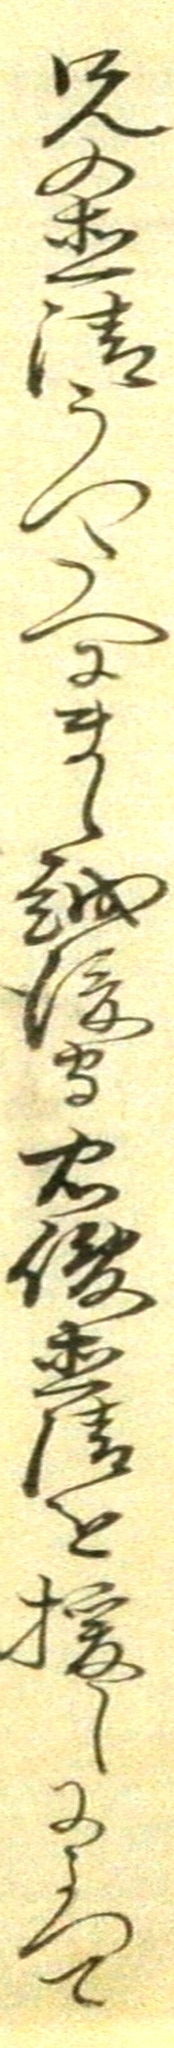兄の直清うつたへにまし越後守忠俊直清を援しによつて
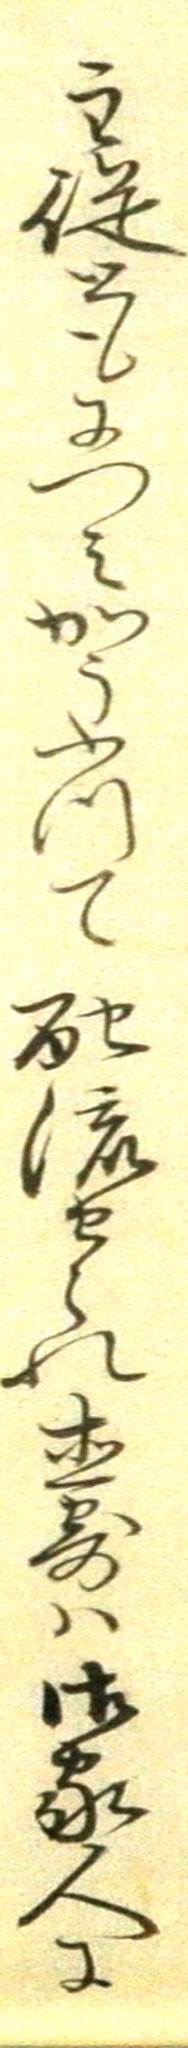主従ともにつみかうふつて配流せられ直寄は御家人に
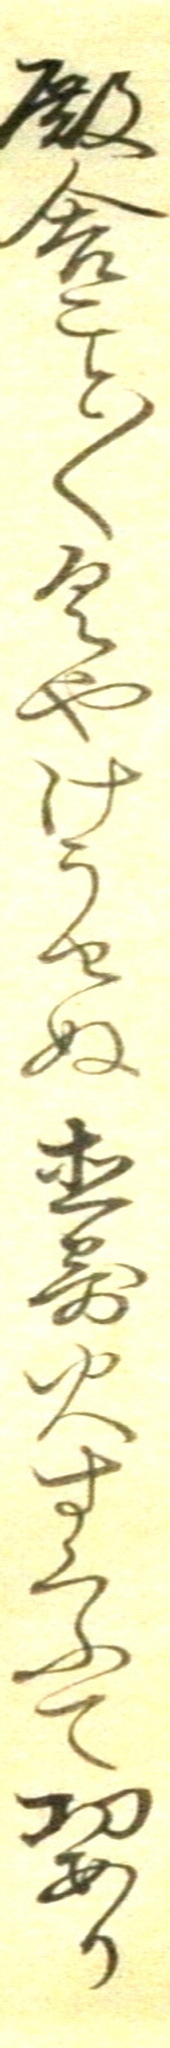殿舎こと〳〵くやけうせぬ直寄火すくふて功あり
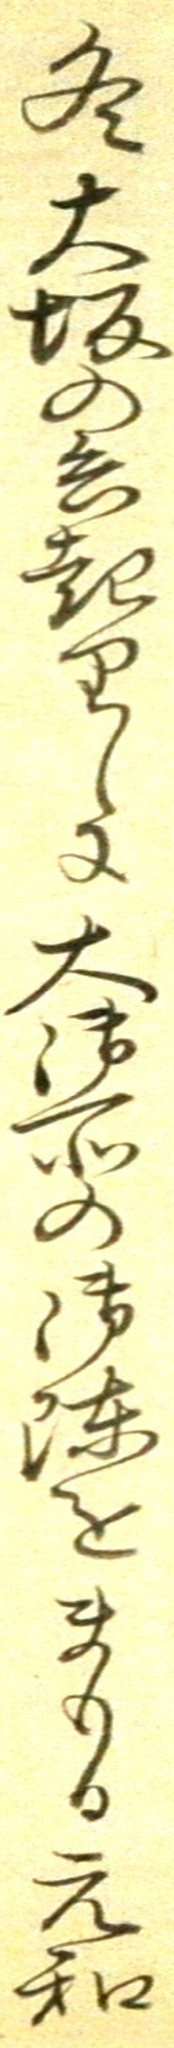冬大坂の兵起りしに大御所の御陣をまもる元和
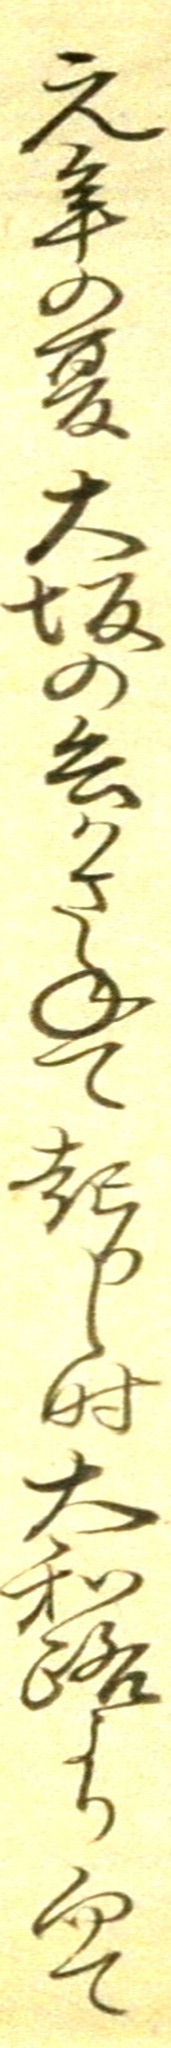元年の夏大坂の兵かさねて起りし時大和路より向て
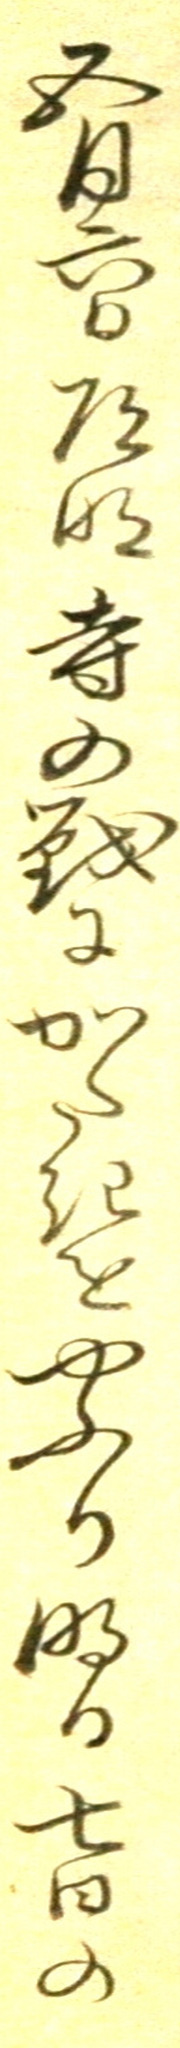五月六日道明寺の戦にかたきをやふり明る七日の

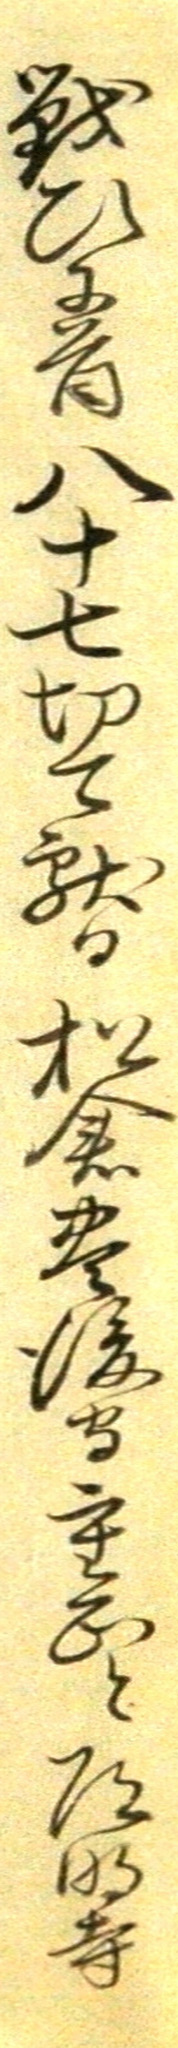戦ひに首八十七切て献る松倉豊後守重正と道明寺
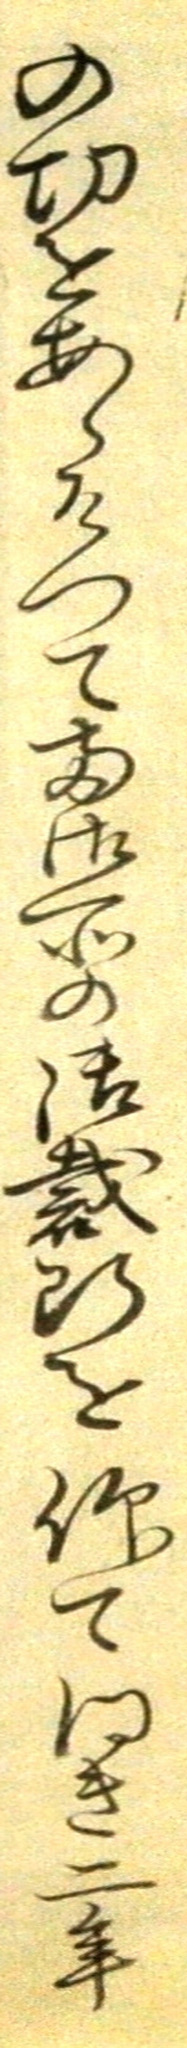の功をあらそつて両御所の御裁断を仰て同き二年
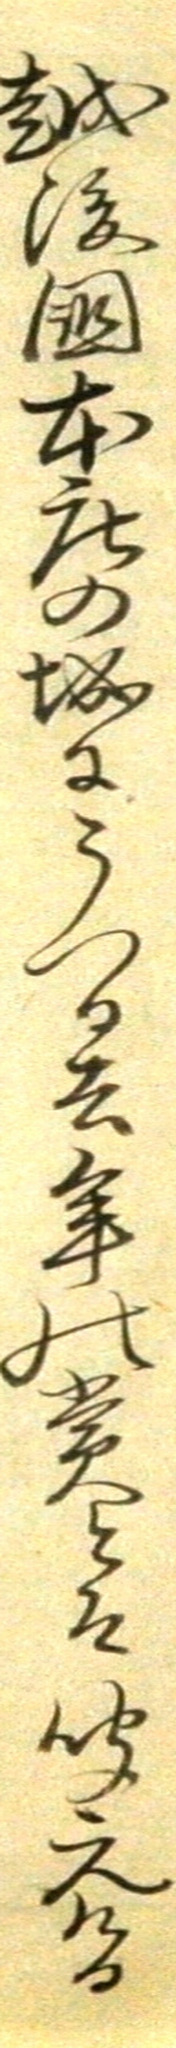越後国本庄の城にうつる去年の賞とそ聞えける
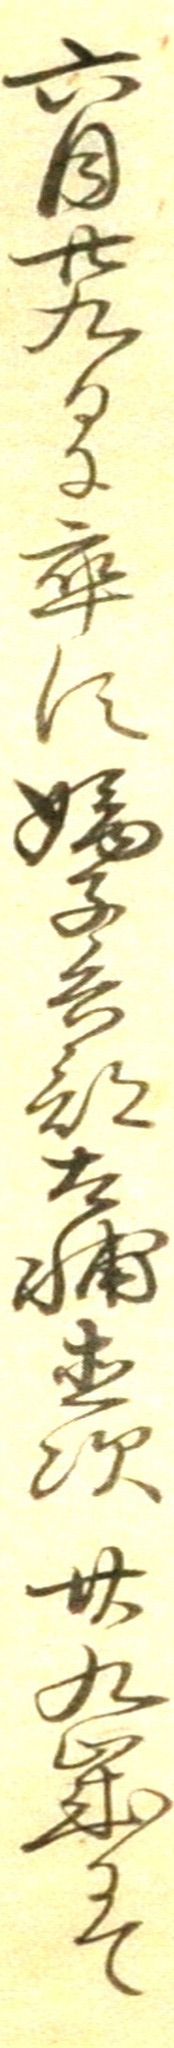六月廿九日に卒す嫡子兵部太輔直次廿九歳にて
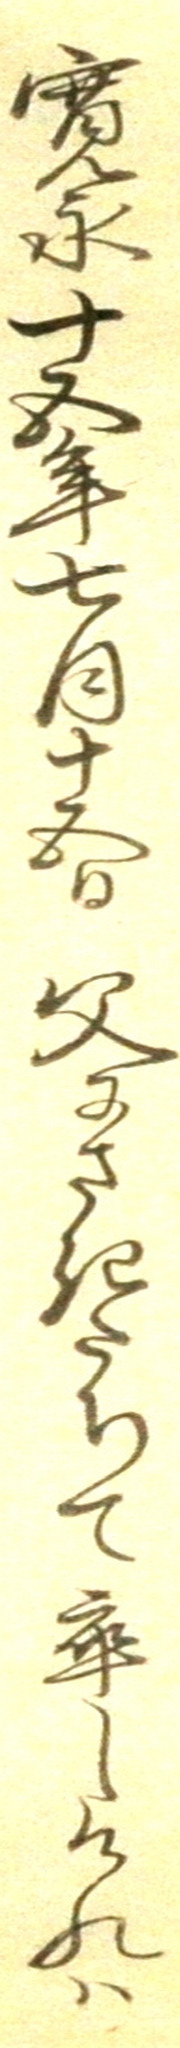寛永十五年七月十五日父にさきたちて卒しけれは
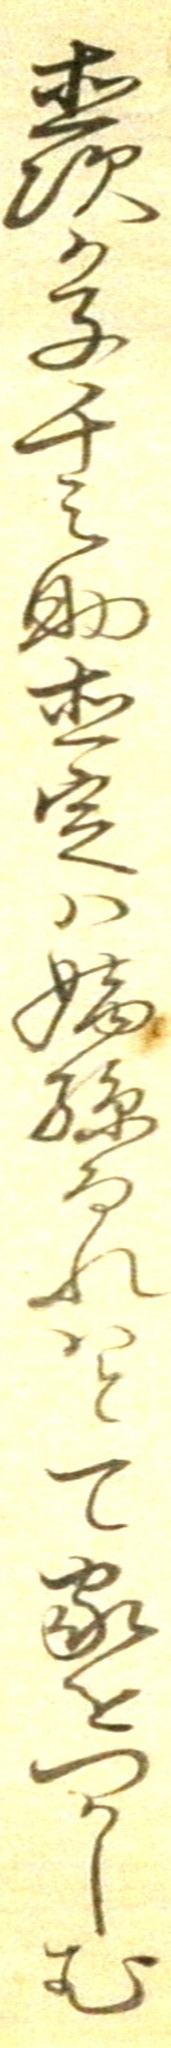直次か子千之助直定は嫡孫なれはとて家をつかしむ
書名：藩翰譜（七・上）
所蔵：伊那市立高遠町図書館・合同会社AMANE
